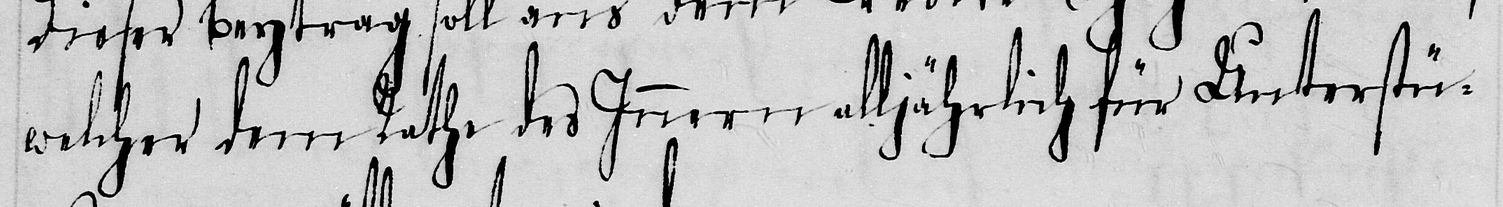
welcher dem Rathe des Innern alljährlich für Unterstüt¬
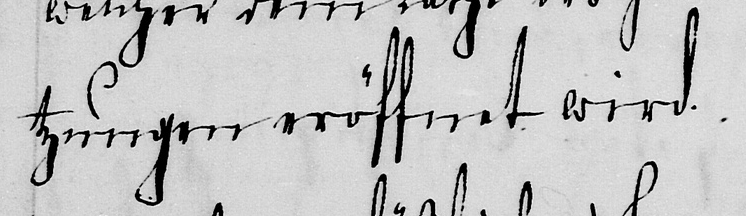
zungen eröffnet wird.
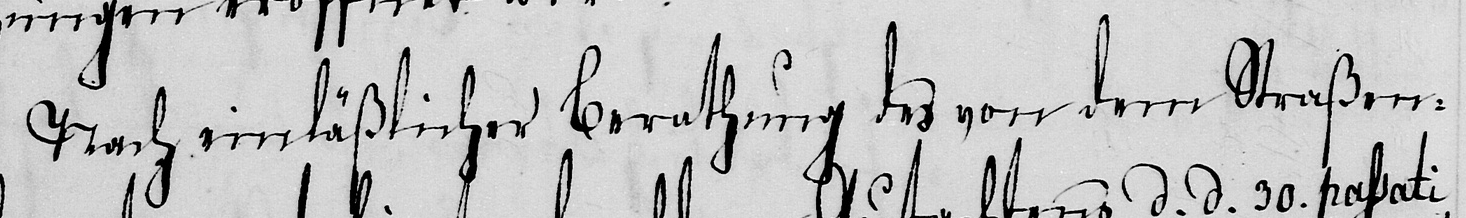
Nach einläßlicher Berathung des von dem Straßen¬
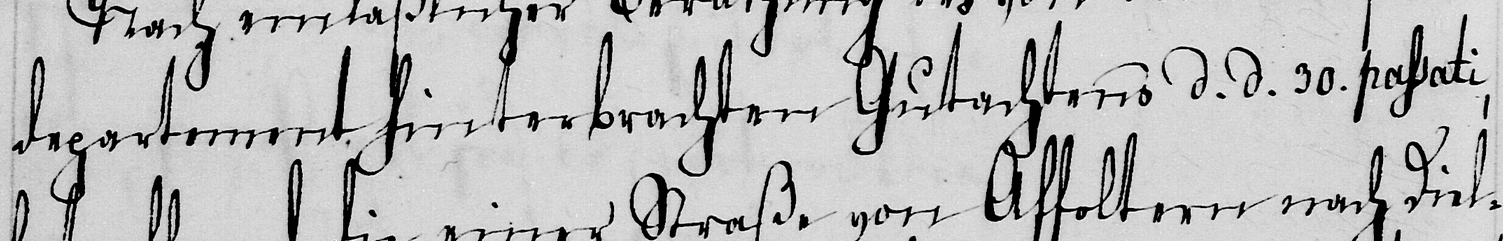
departement hinterbrachten Gutachtens d. d. 30. pas¬
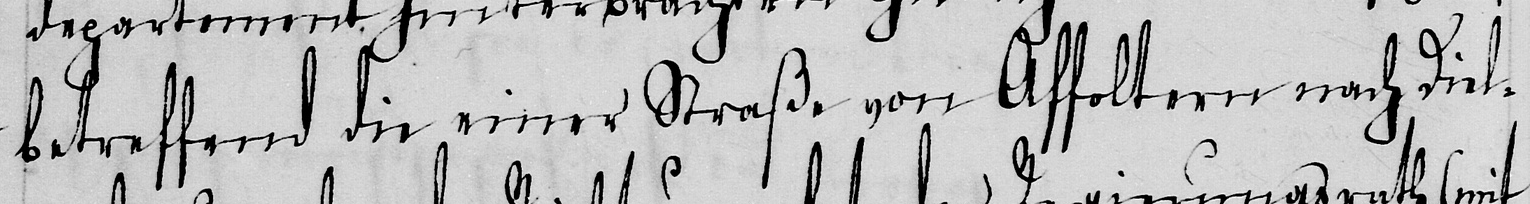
betreffend die einer Straße von Affoltern nach Diel¬
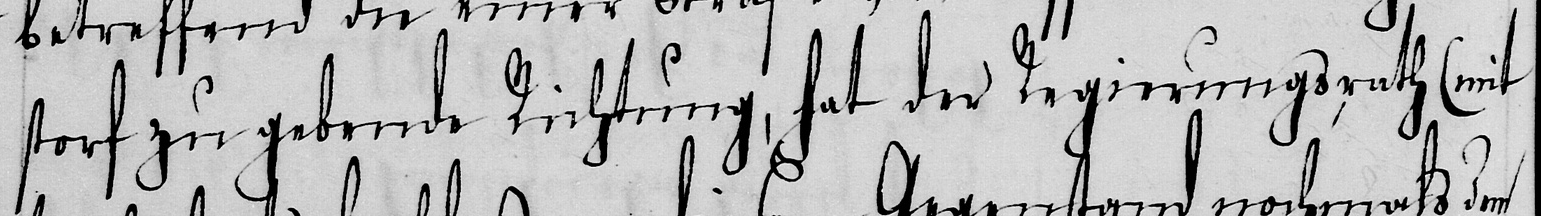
storf zu gebende Richtung, hat der Regierungsrath (mit
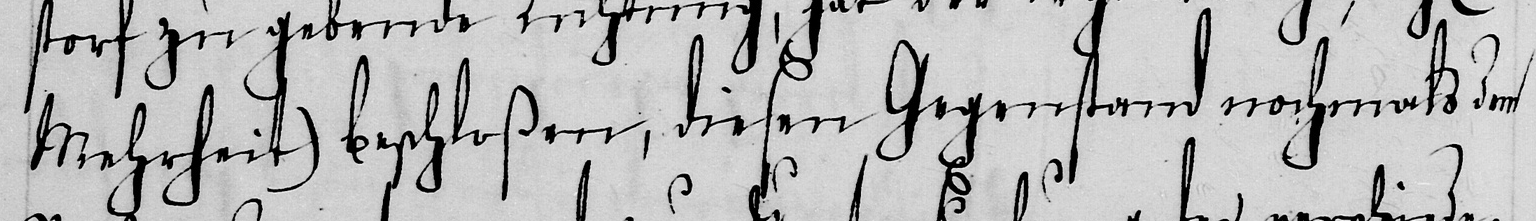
Mehrheit) beschloßen, diesen Gegenstand nochmahls dem
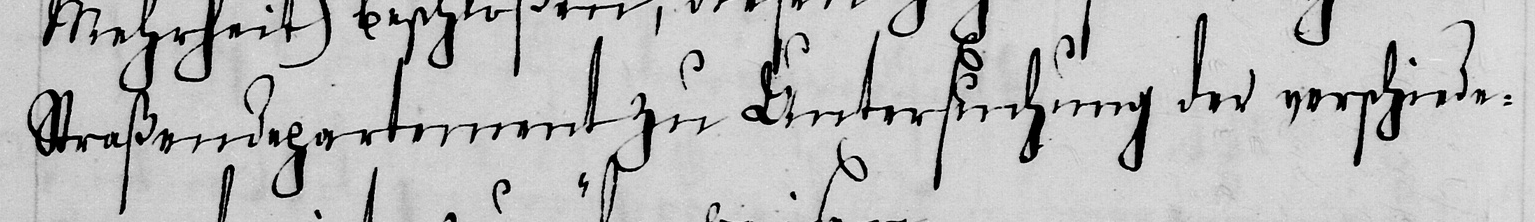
Straßendepartement zu Untersuchung der verschiede¬
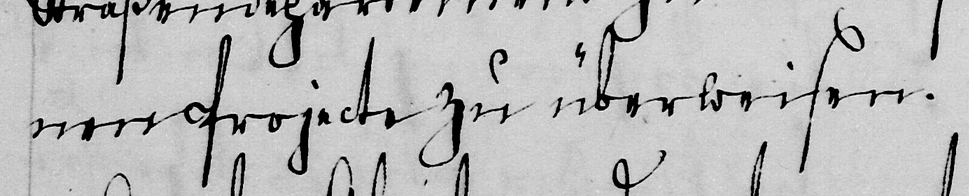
nen Projecte zu überweisen.
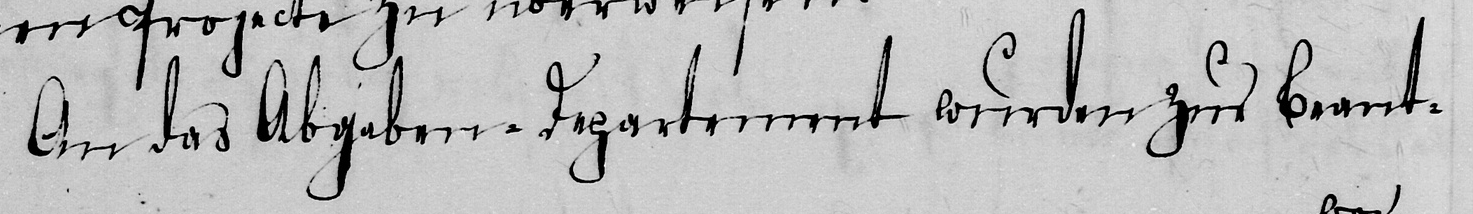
An das Abgaben-Departement wurden zur Beant-
